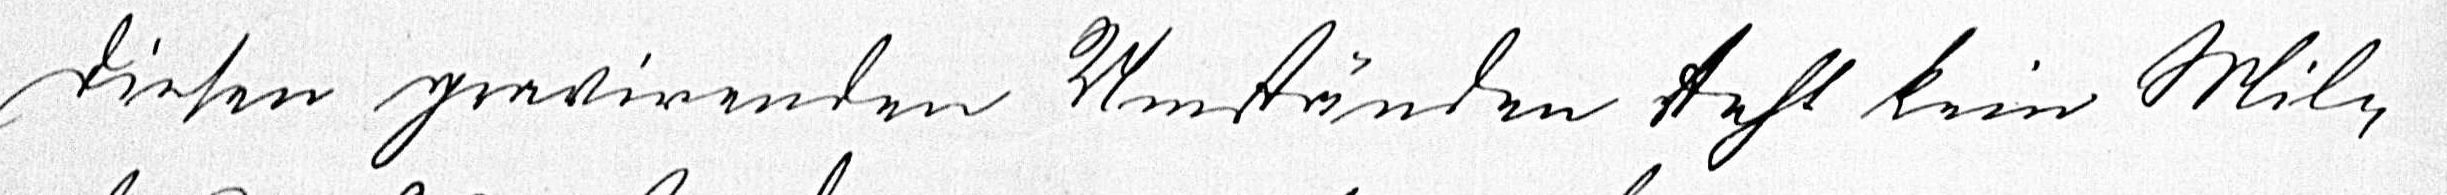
Diesen gravirenden Umständen steht kein Mil¬
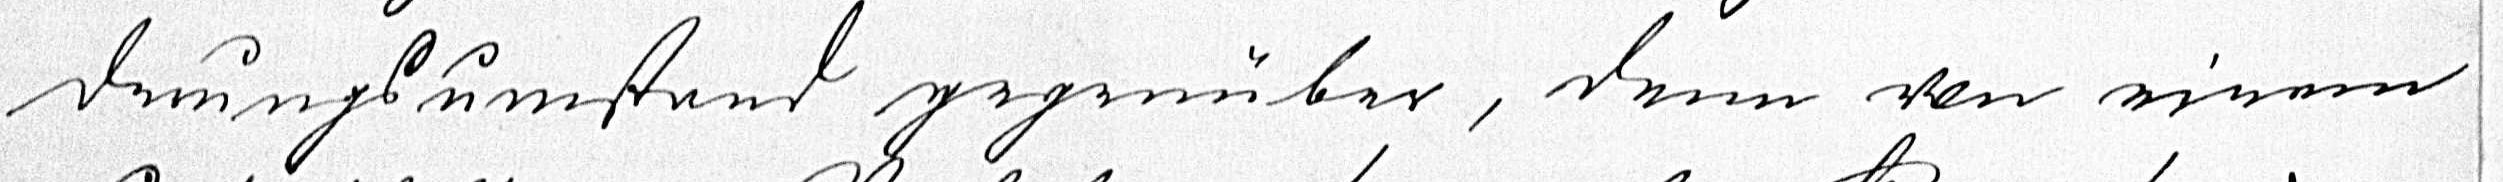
derungsumstand gegenüber, denn von einem
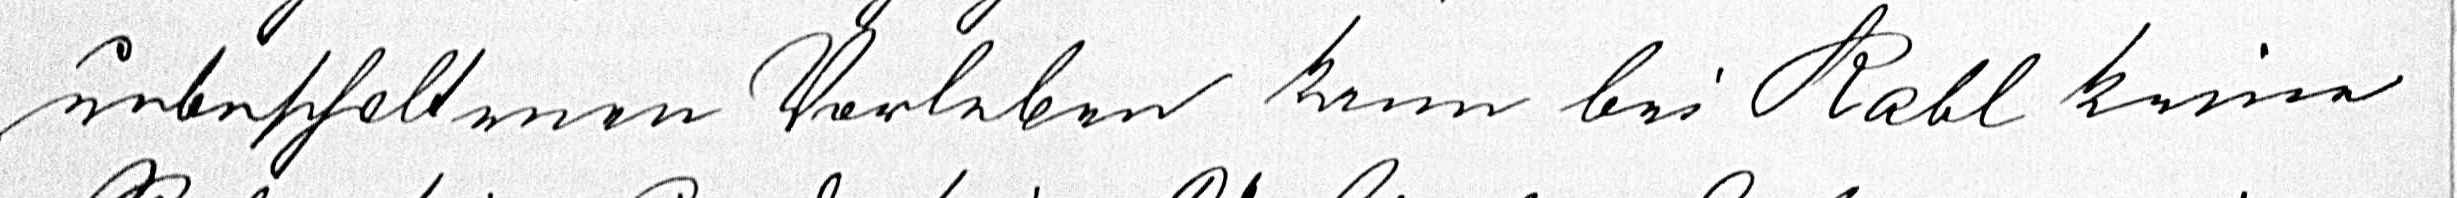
unbescholtenen Vorleben kann bei Rabl keine
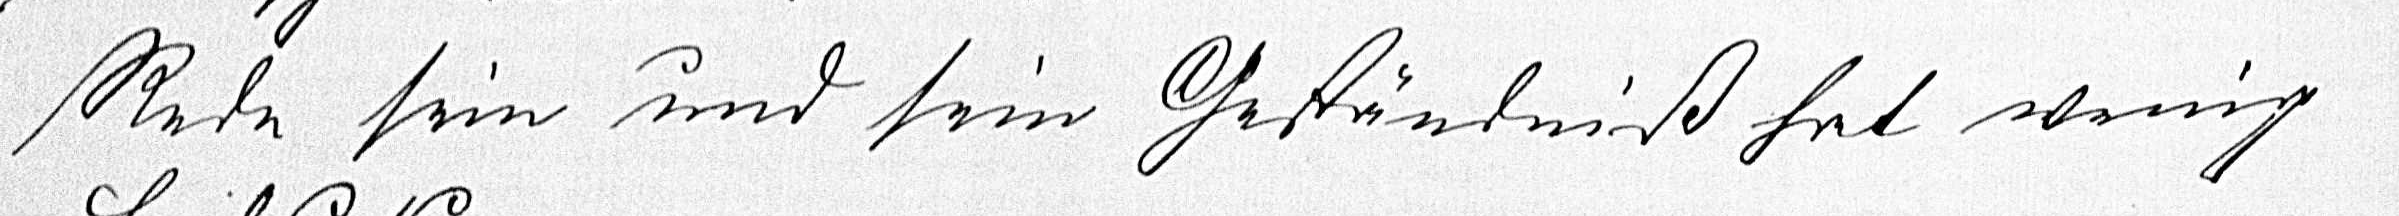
Rede sein und sein Geständniß hat wenig
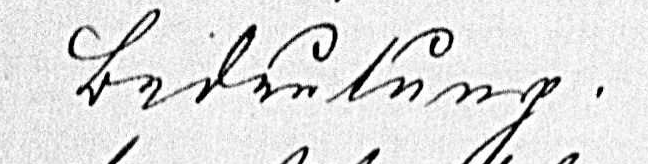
Bedeutung.
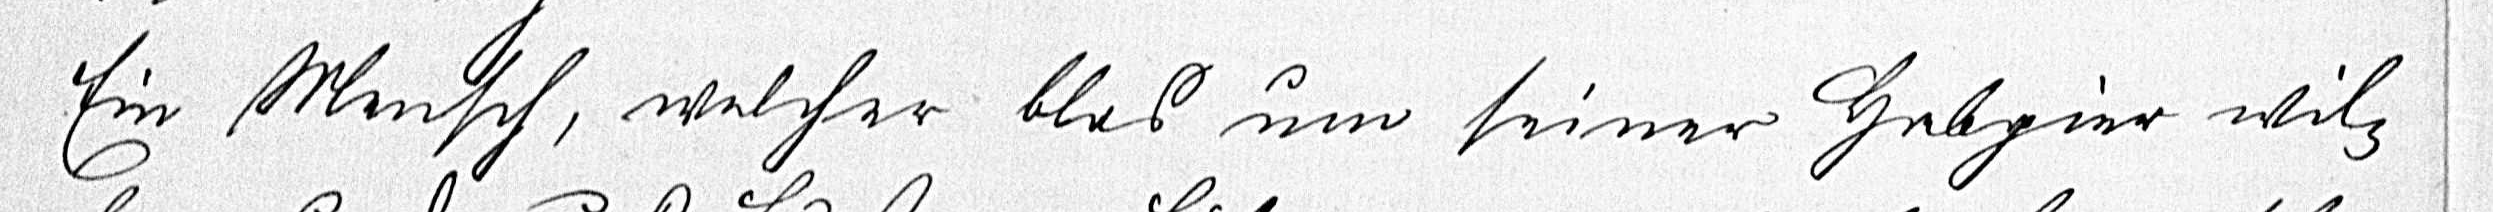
Ein Mensch, welcher blos um seiner Habgier wil¬
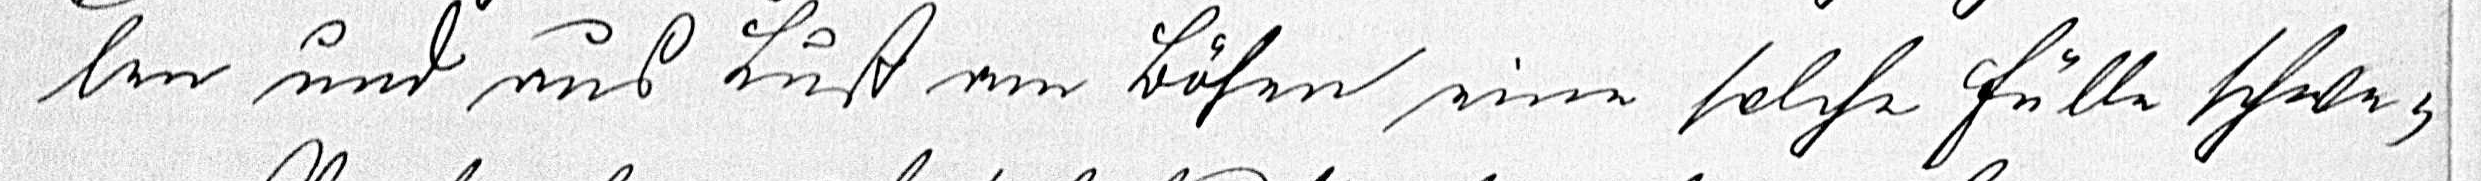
len und aus Lust am Bösen eine solche Fülle schwe¬
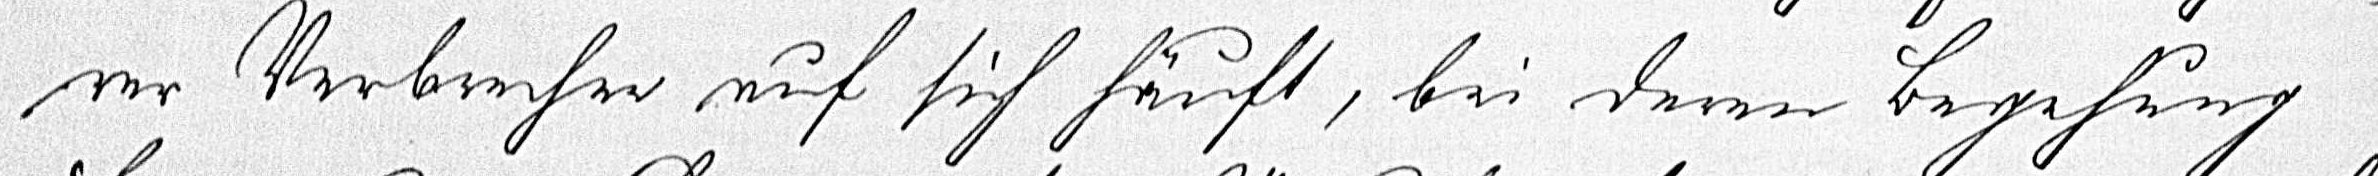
rer Verbrecher auf sich häuft, bei deren Begehung
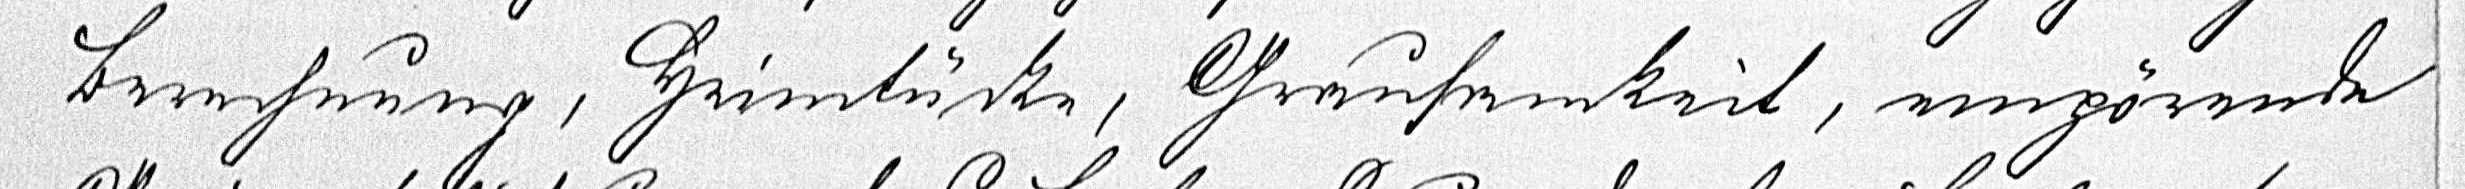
Berechnung, Heimtürke, Grausamkeit, empörende
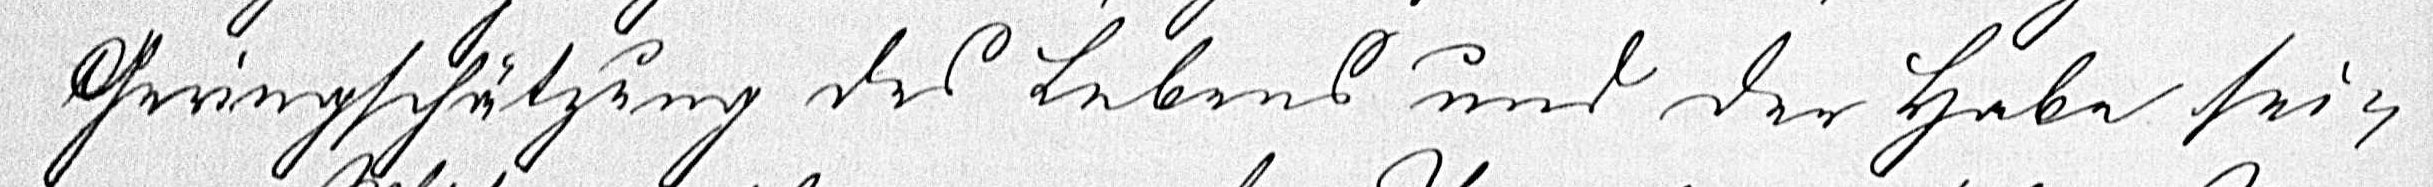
Geringschätzung des Lebens und der Habe sei¬
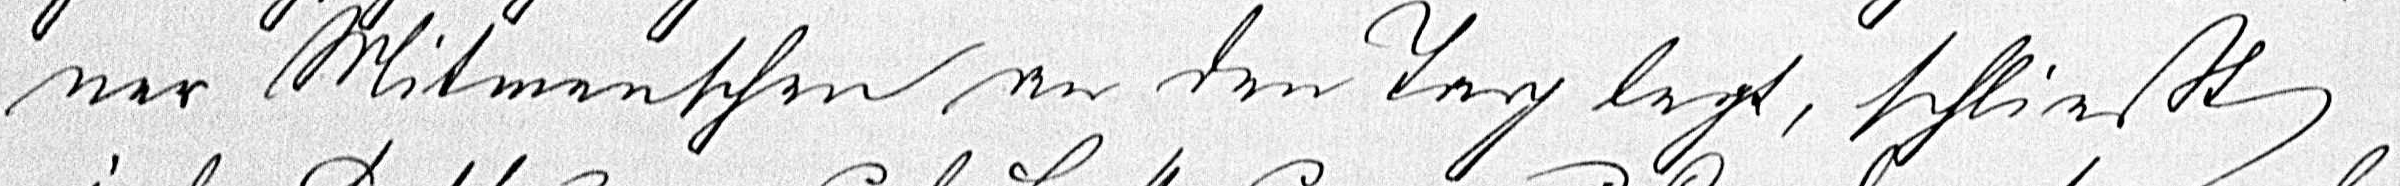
ner Mitmenschen an den Tag legt, schließt
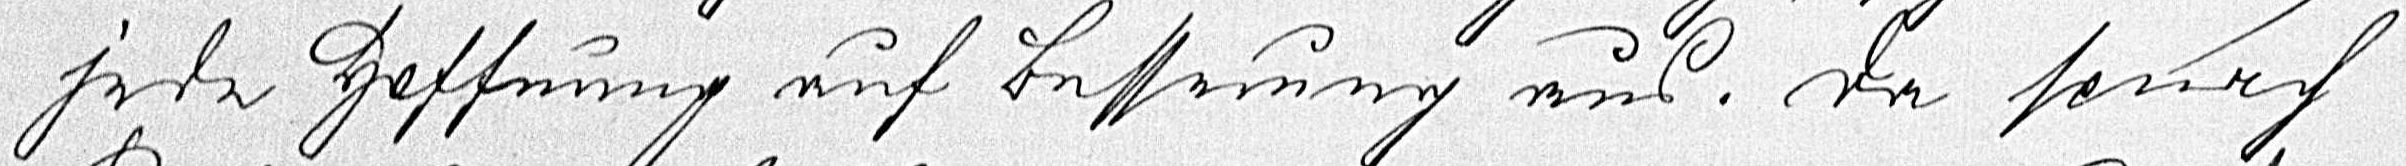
jede Hoffnung auf Besserung aus. Da sonach
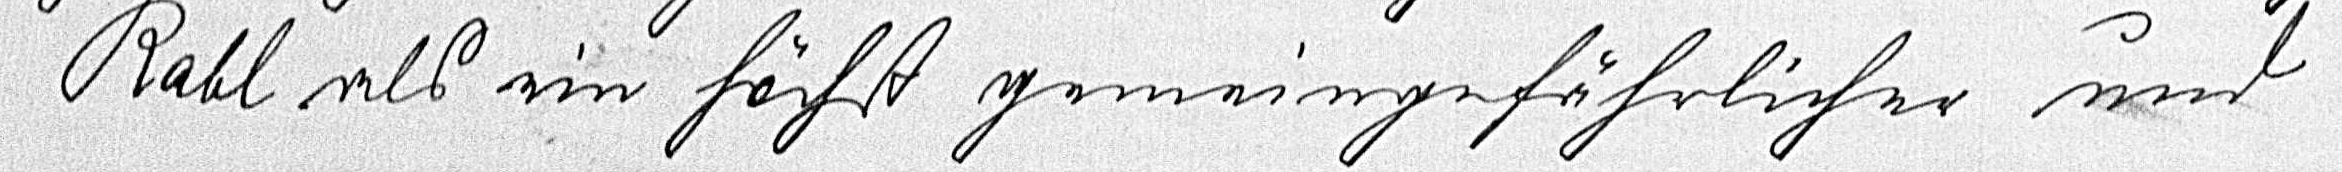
Rabl als ein höchst gemeingefährlicher und
